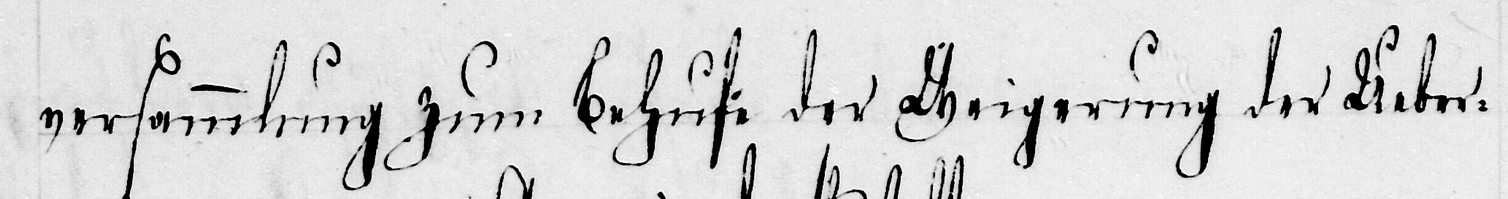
versammlung zum Behufe der Weigerung der Ueber¬
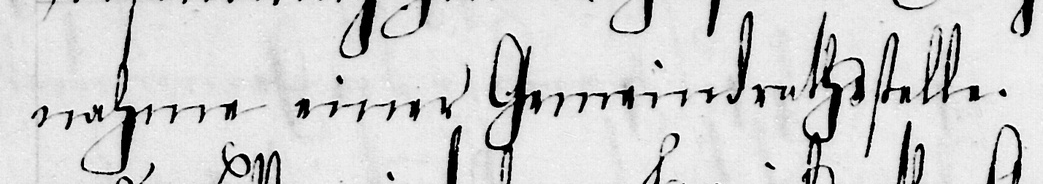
nahme einer Gemeindrathsstelle.
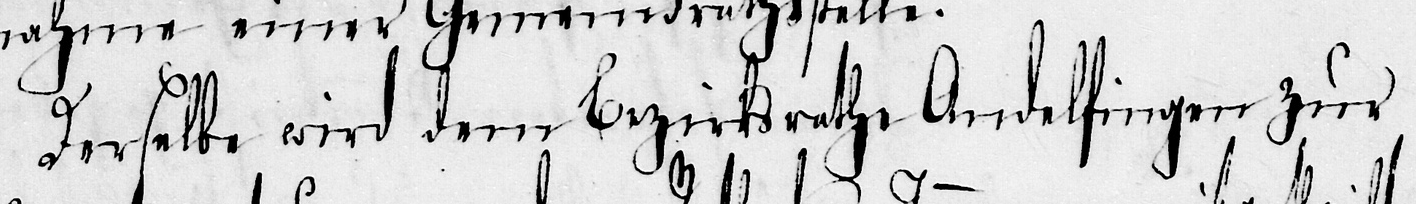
Derselbe wird dem Bezirksrathe Andelfingen zur
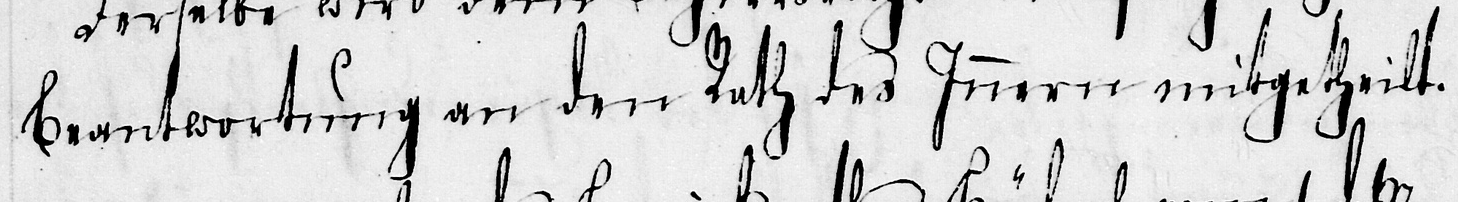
Beantwortung an den Rath des Innern mitgetheilt.
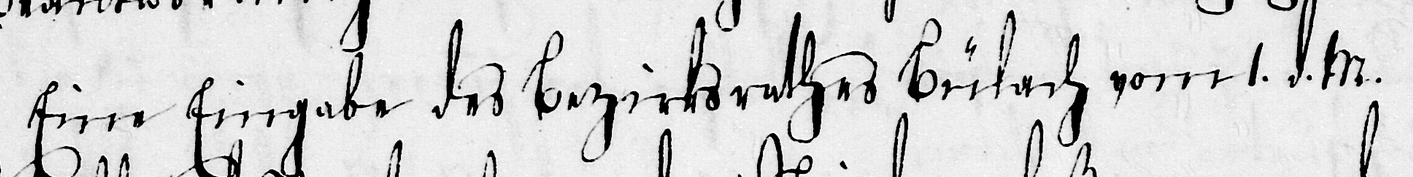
Eine Eingabe des Bezirksrathes Bülach vom 1. d. M.
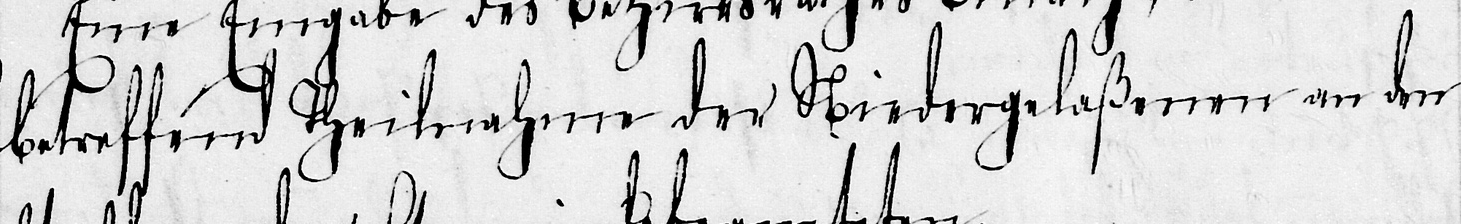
betreffend Theilnahme der Niedergelaßenen an den
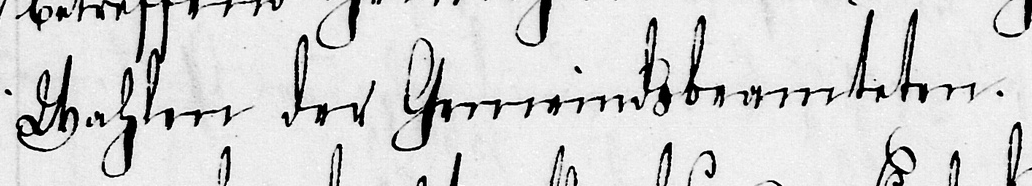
Wahlen der Gemeindsbeamteten.
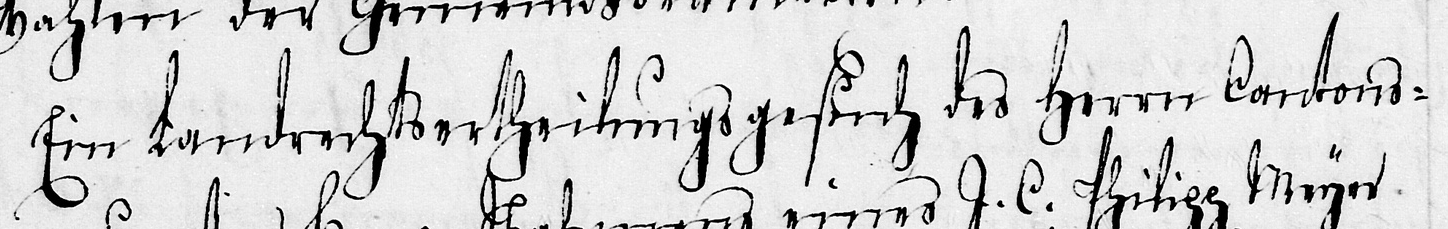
Ein Landrechtsertheilungsgesuch des Herrn Canton¬
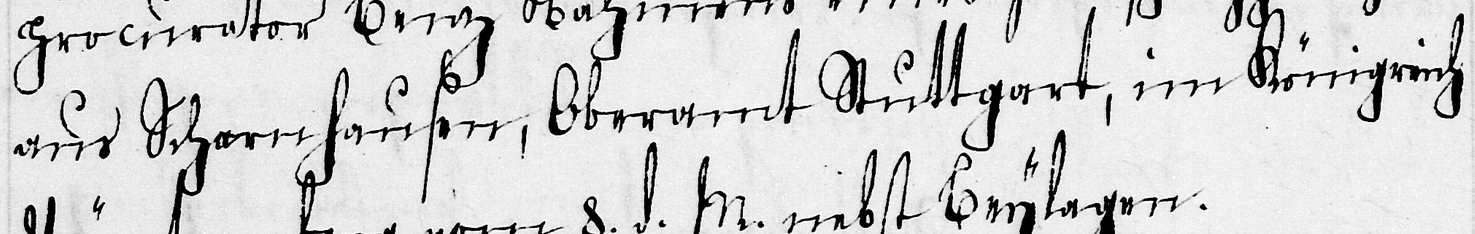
aus Scharnhausen, Oberamt Stuttgart, im Königreich
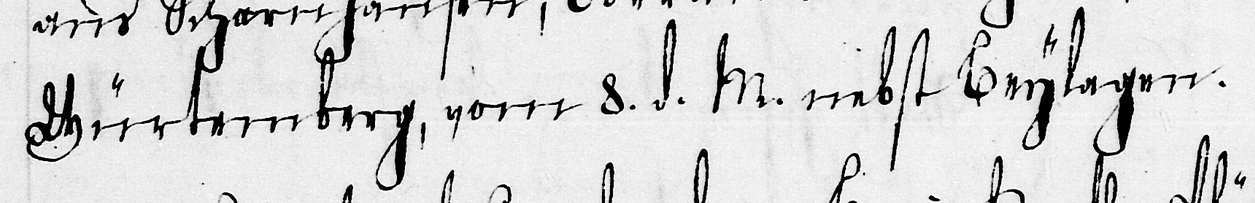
Würtemberg, vom 8. d. M. nebst Beylagen.
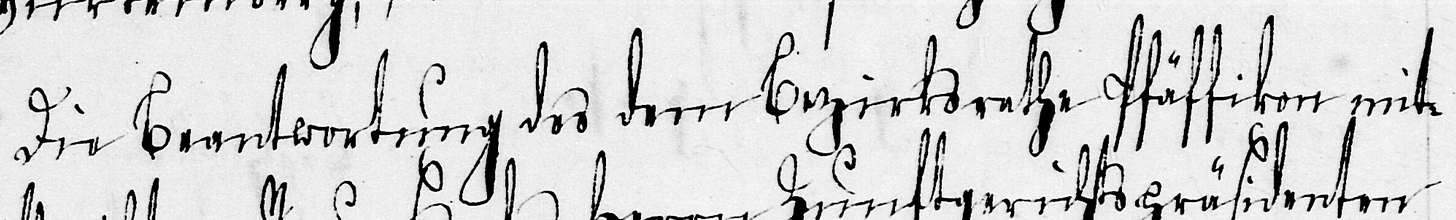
Die Beantwortung des dem Bezirksrathe Pfäffikon mit¬
